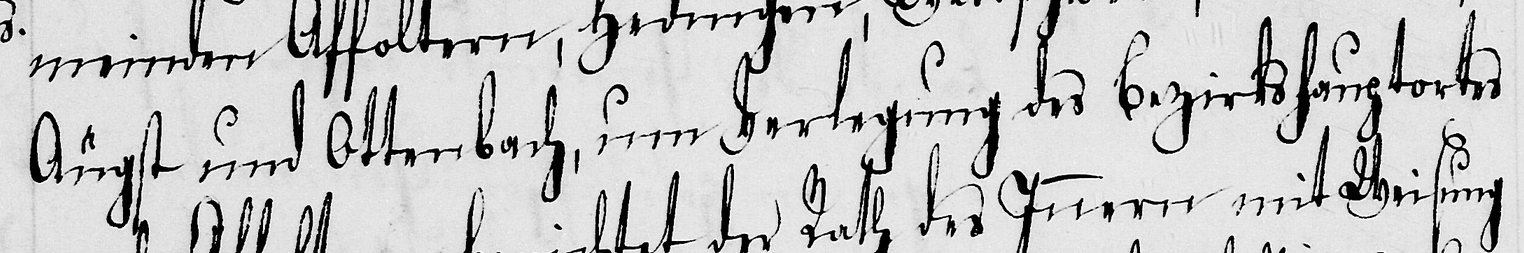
Augst und Ottenbach, um Verlegung des Bezirkshauptortes
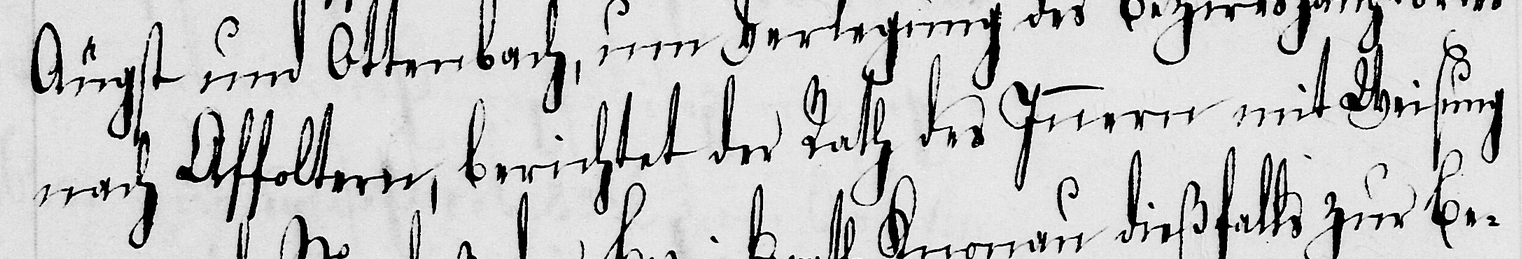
nach Affoltern, berichtet der Rath des Innern mit Weisung
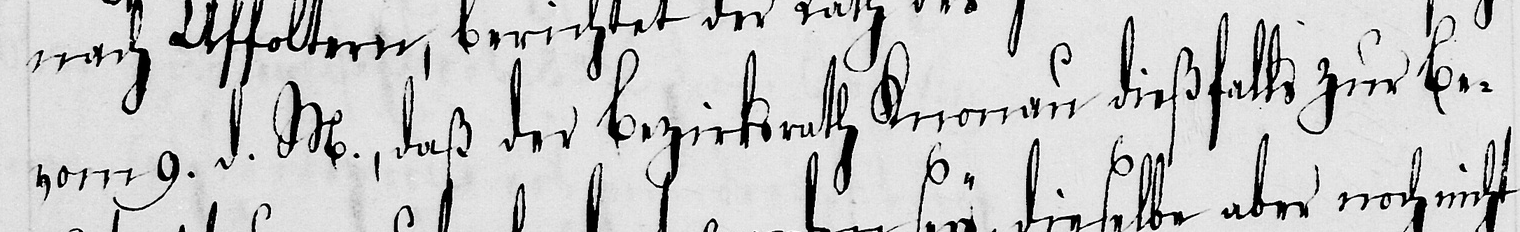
vom 9. d. M., daß der Bezirksrath Knonau dießfalls zur Be¬
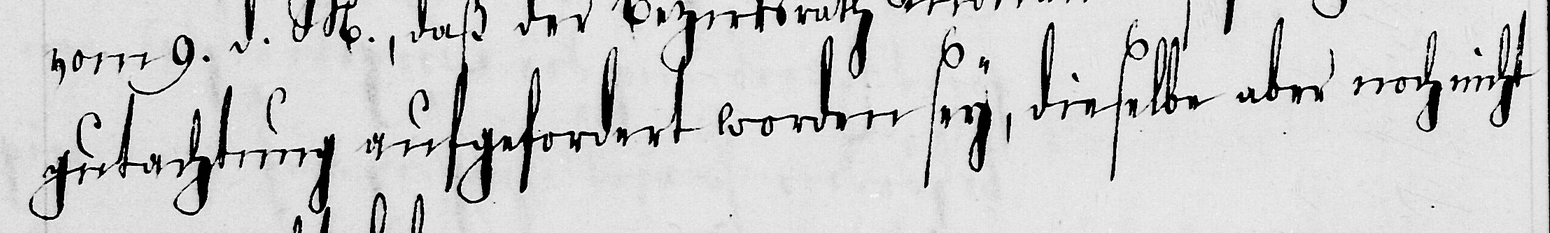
gutachtung aufgefordert worden sey, dieselbe aber noch
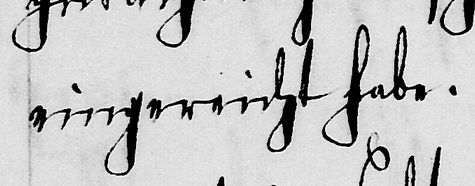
eingereicht habe.
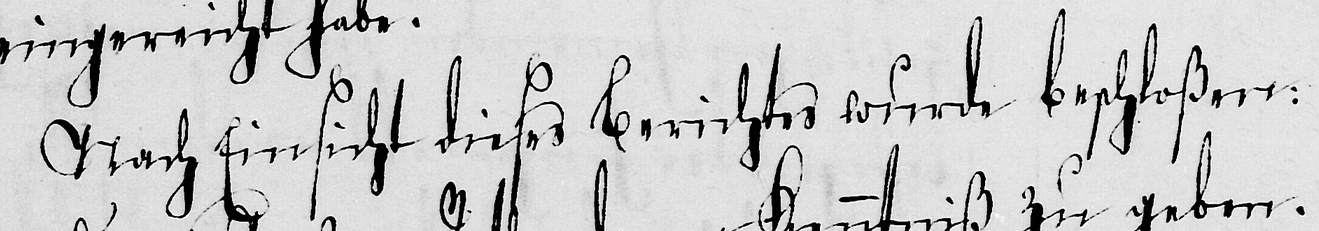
Nach Einsicht dieses Berichtes wurde beschloßen:
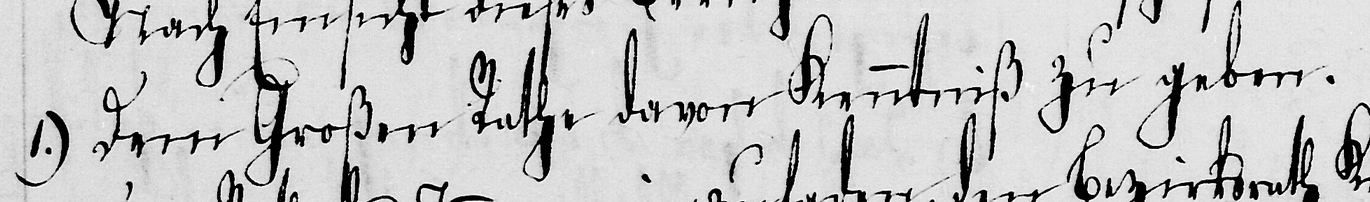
1.) Dem Großen Rathe davon Kenntniß zu geben.
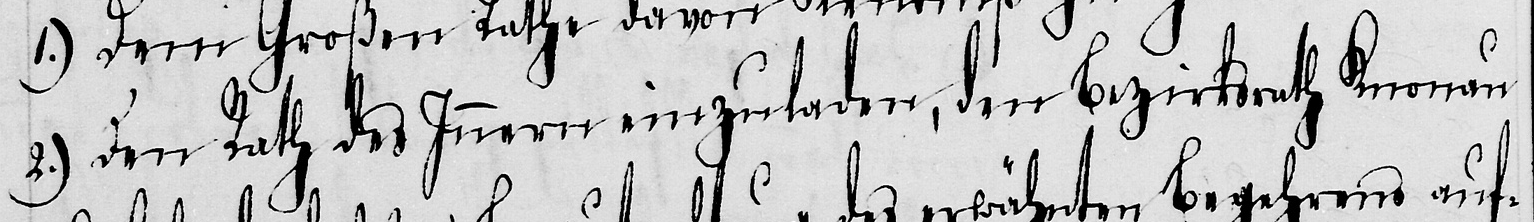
2.) Den Rath des Innern einzuladen, den Bezirksrath Knonau
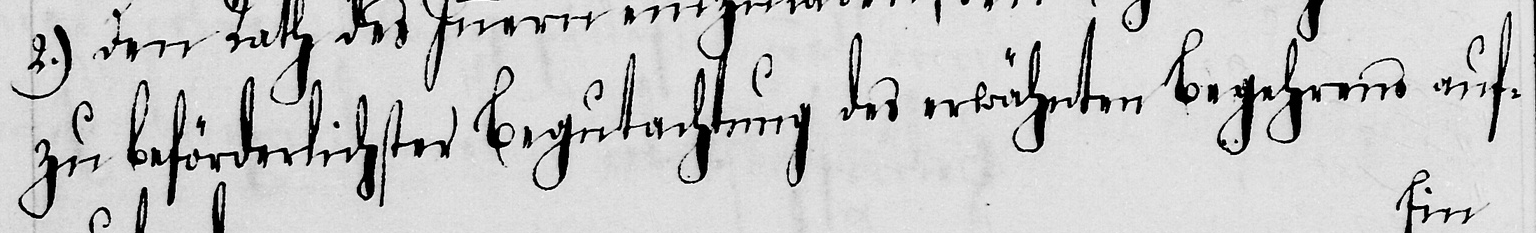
zu beförderlichster Begutachtung des erwähnten Begehrens auf¬
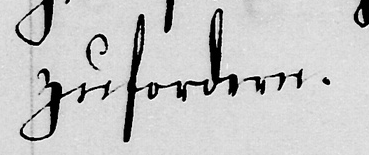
zufordern.
